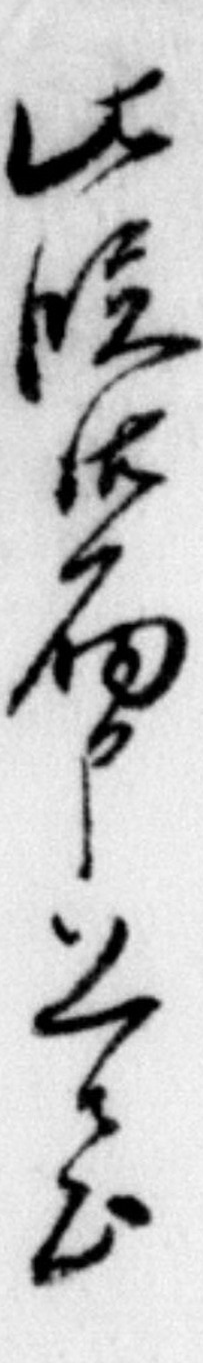此段御届申上候以上

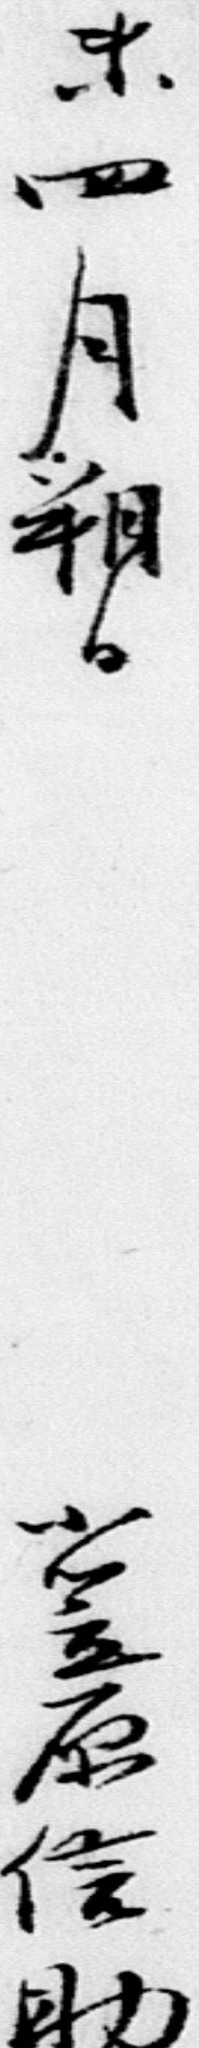未四月朔日小笠原信助
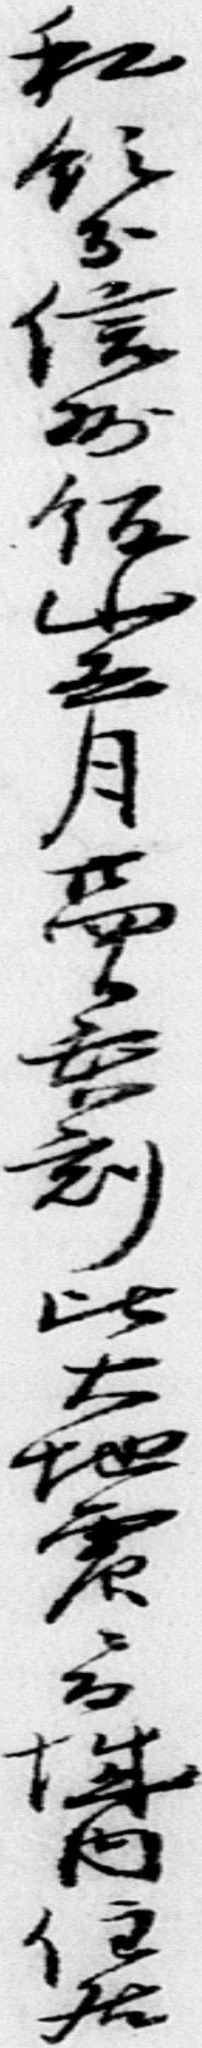私領分信州飯山三月廿四日亥刻頃大地震に而城内住居
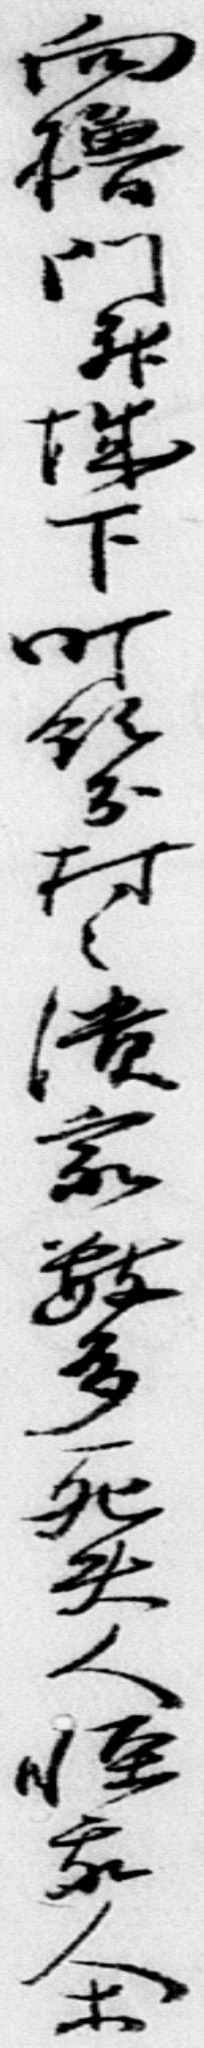向櫓門幷城下町領分村々潰家数多死失人怪我人等
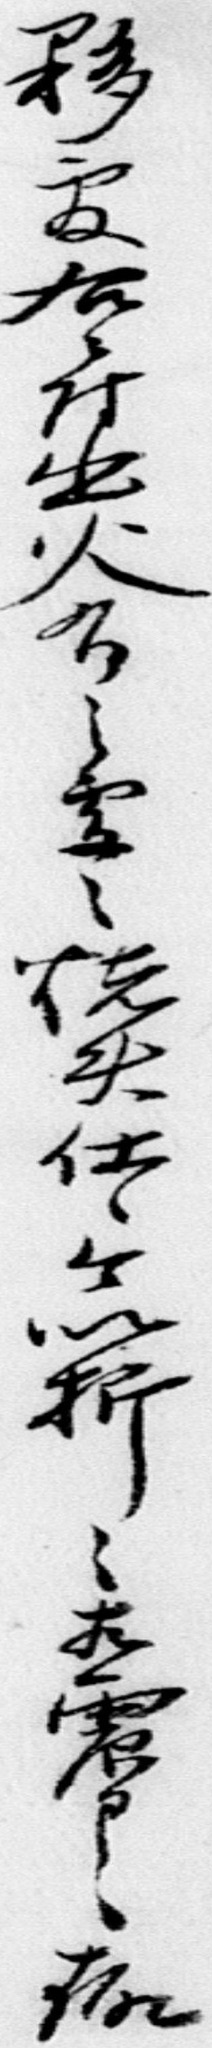夥敷右に付出火有之処々焼失仕候今以折々相震申候趣
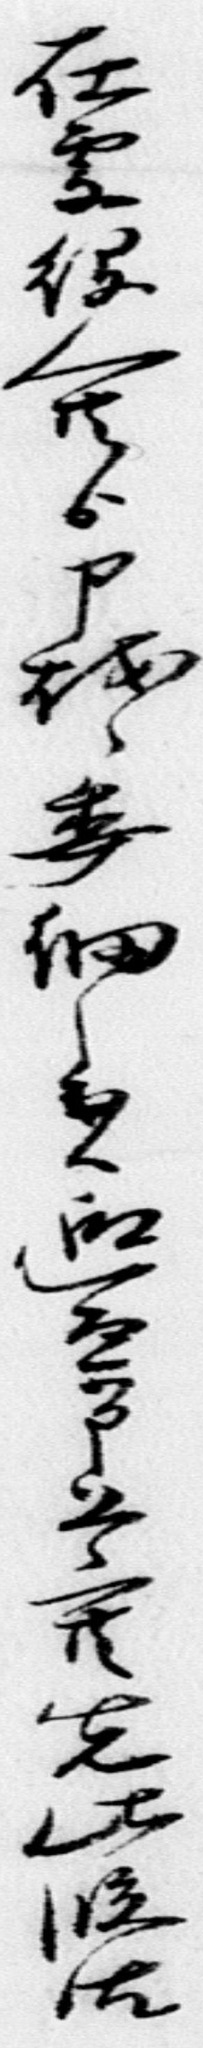在処役人共ゟ申越委細之義は追而可申上候へ共先此段御
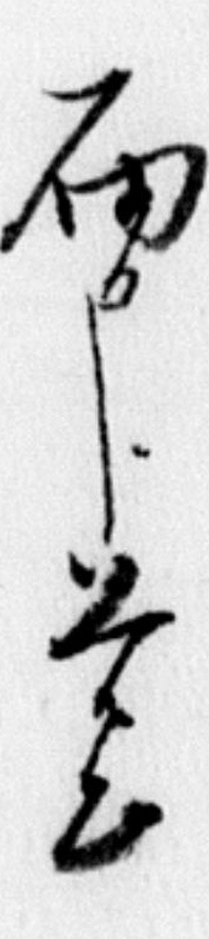届申上候以上
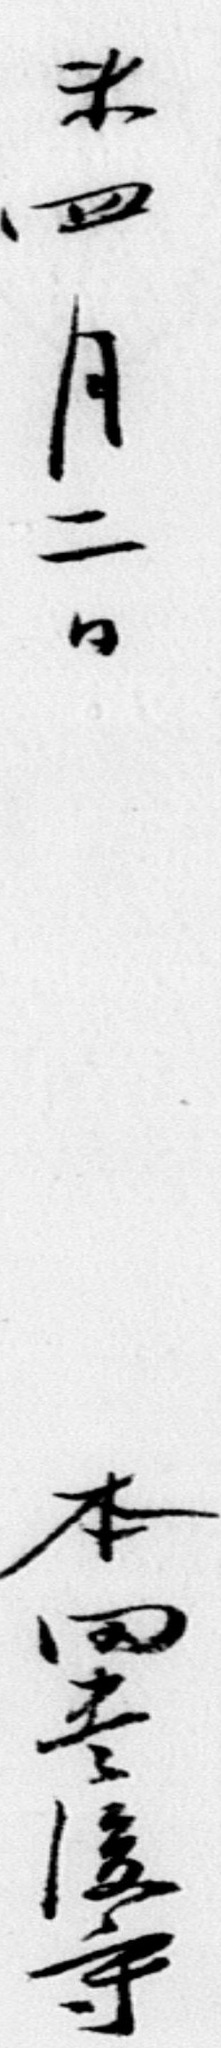未四月二日本田豊後守
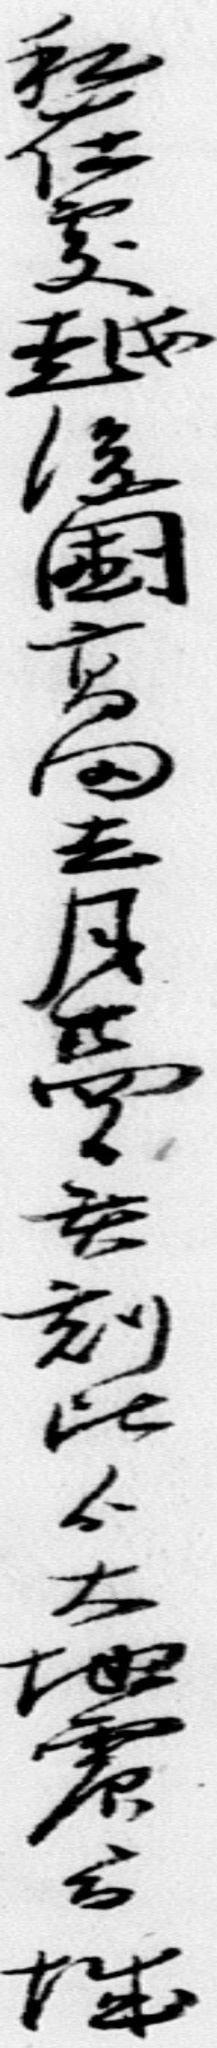私在所越後国高田去月廿四日亥刻頃ゟ大地震に而城
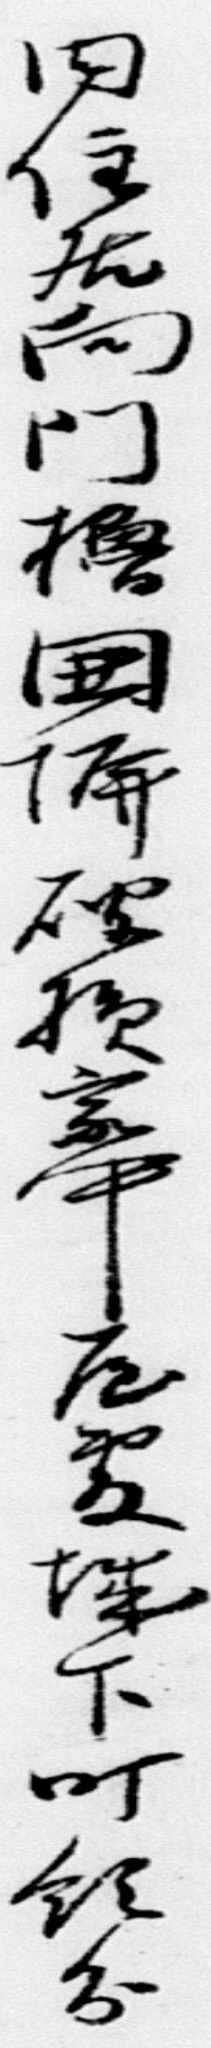内住居向門櫓囲塀破損家中屋敷城下町領分
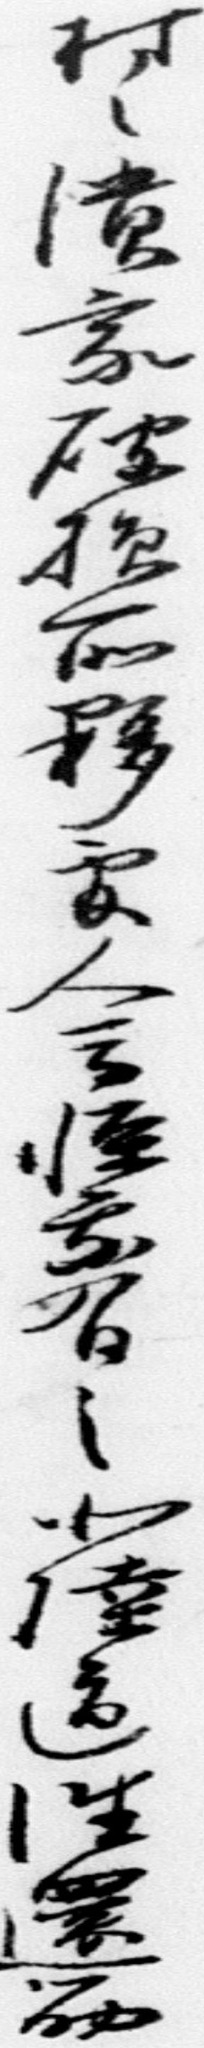村々潰家破損所夥敷人馬怪我有之北陸道往還筋
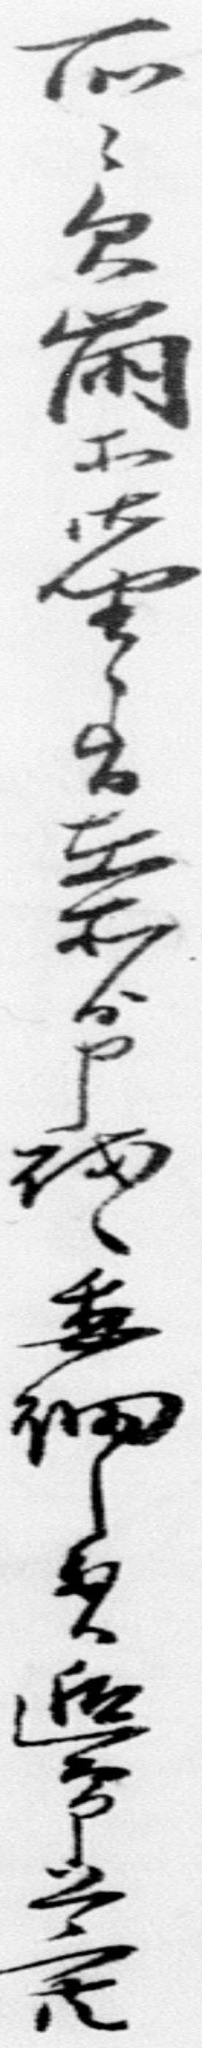所々欠崩等御座候旨在所ゟ申越候委細之義は追而申上候へ共
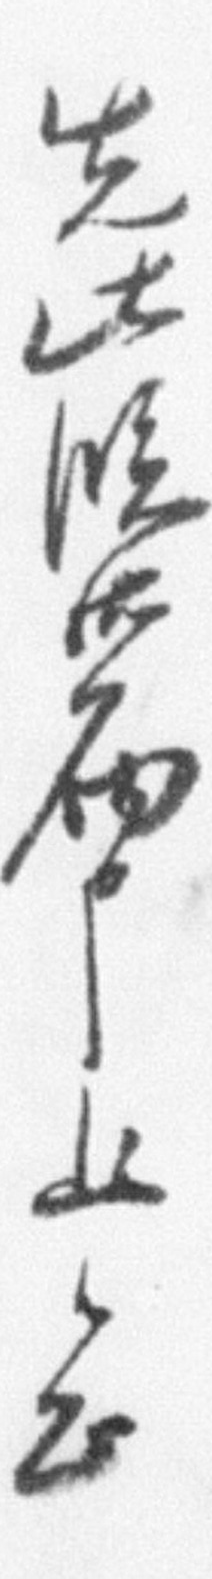先此段御届申上候以上
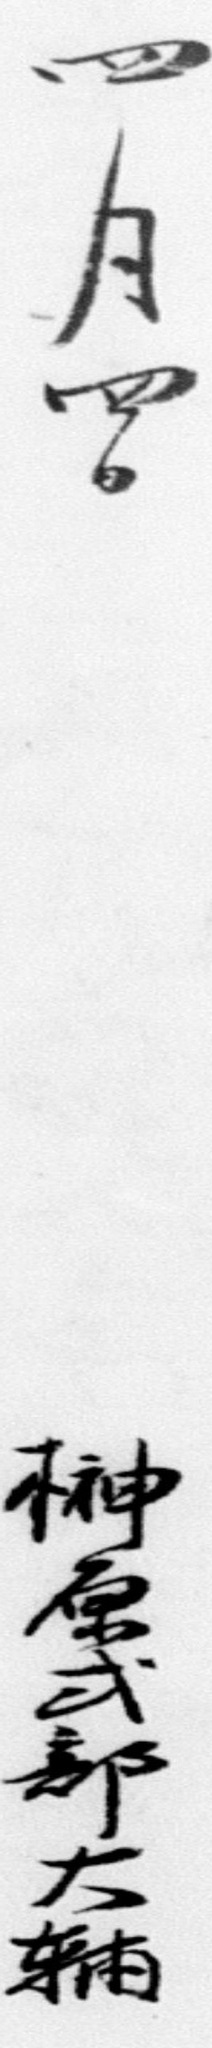四月四日榊原式部大輔
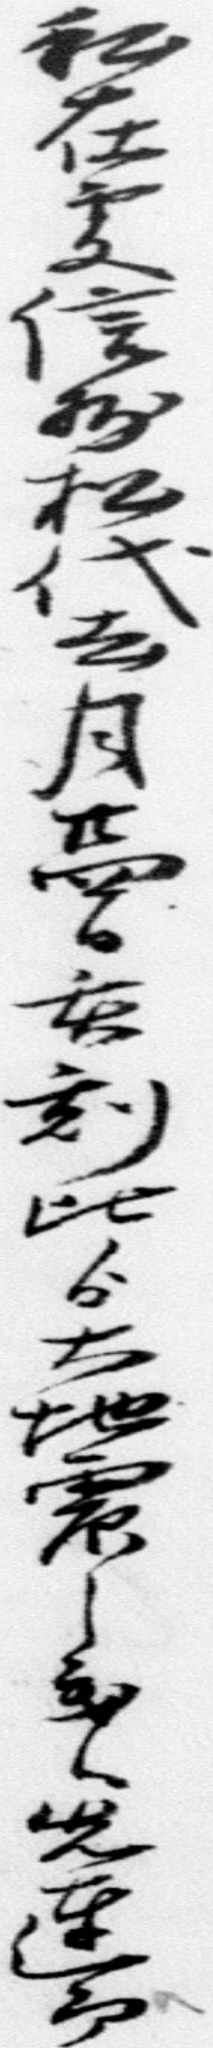私在所信州松代去月廿四日亥刻頃ゟ大地震之義は先達而
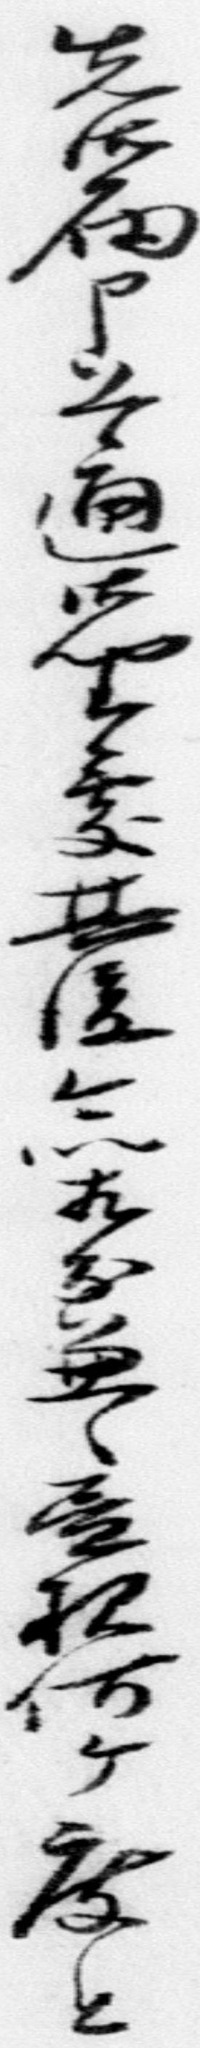先御届申上候通御座候処其後今以相分兼候昼夜何ケ度と
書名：信州大地震一件
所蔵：徳島県立図書館
